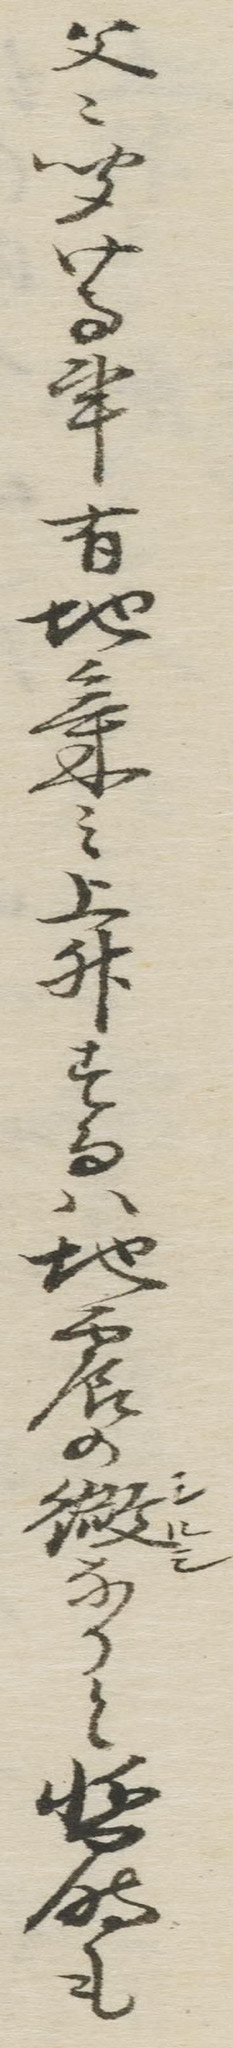父二聞ける事有地気之上升するハ地震の徴なりと暫時も
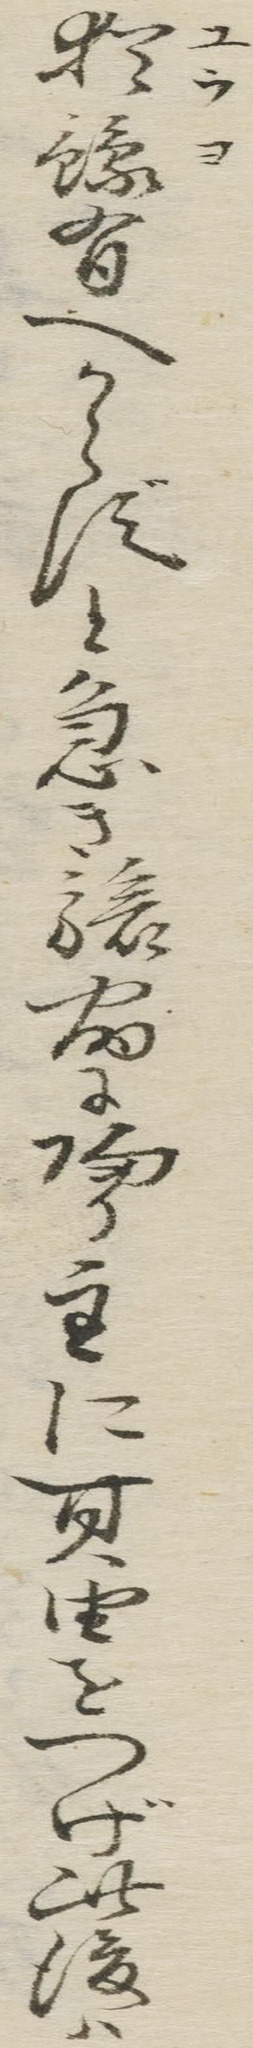猶予有へからずと急ぎ旅宿に帰り主に其由をつげ此後ハ
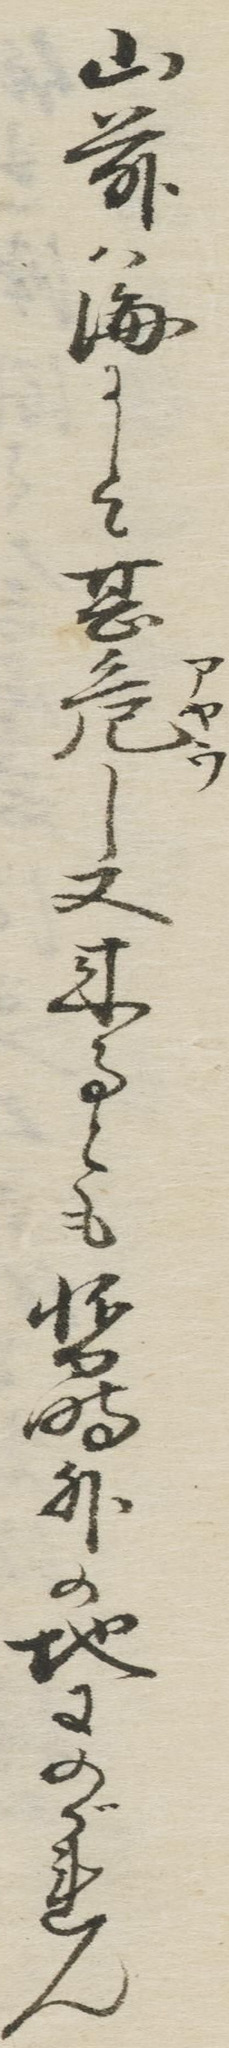山前ハ海にして甚危し又来るとも暫時外の地にのがれん
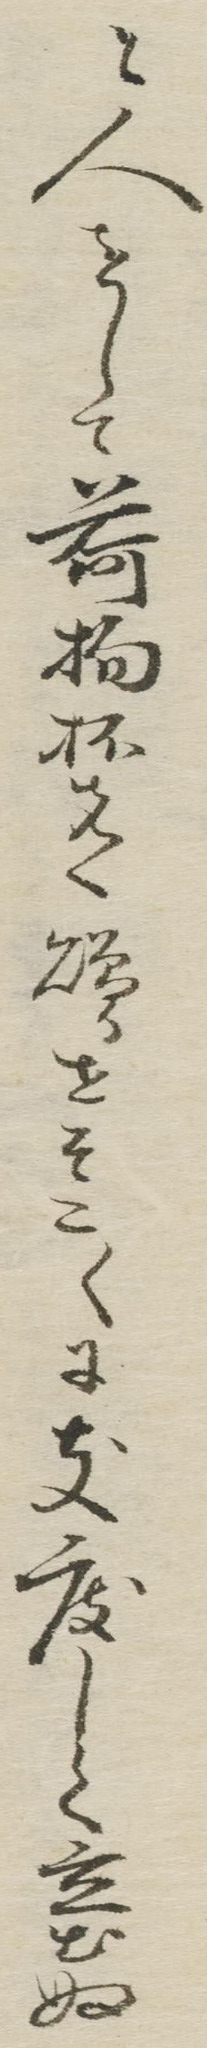と人をして荷物抔先へ贈りことそこ〳〵に支度して立出ぬ
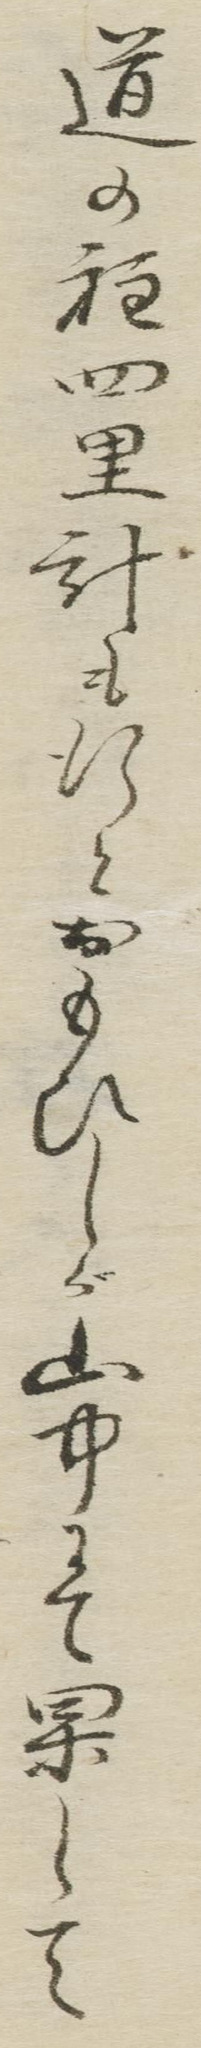道の程四里計も得とおもひしが山中にて果して

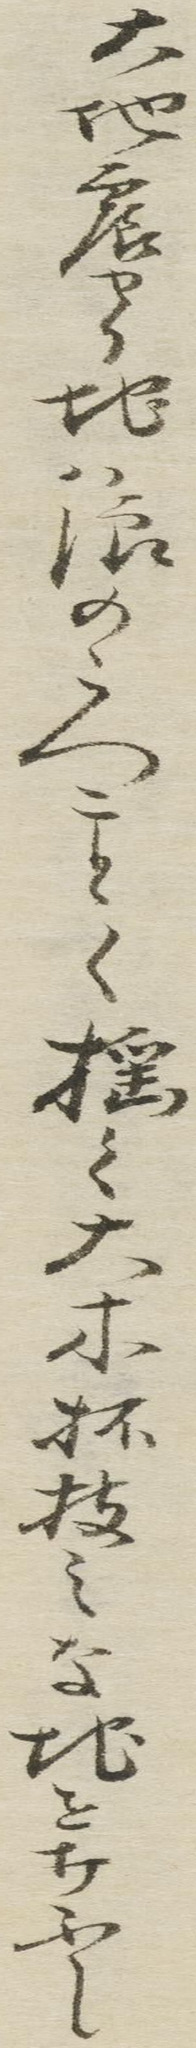大地震アリ地ハ浪のうつことく揺て大木抔枝ミな地を打ふし
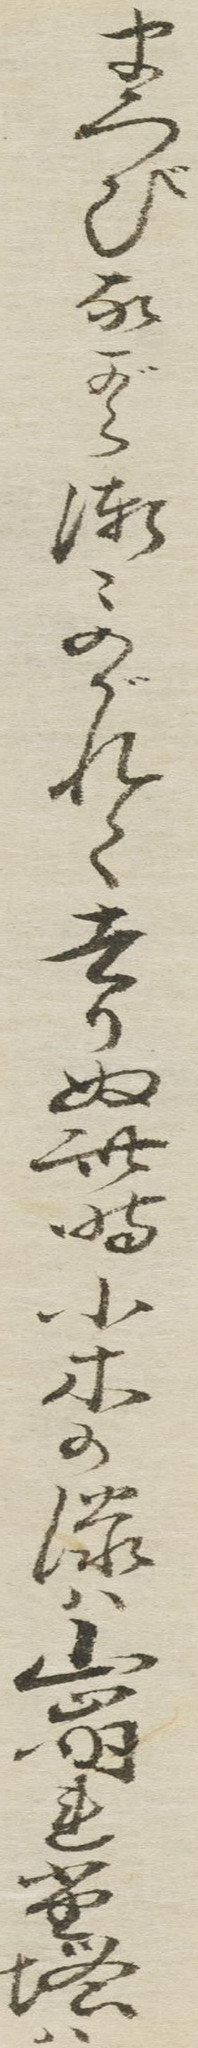なろびながら漸々のがれて去りぬ此時小木の湊ハ山崩れ堂塔ハ
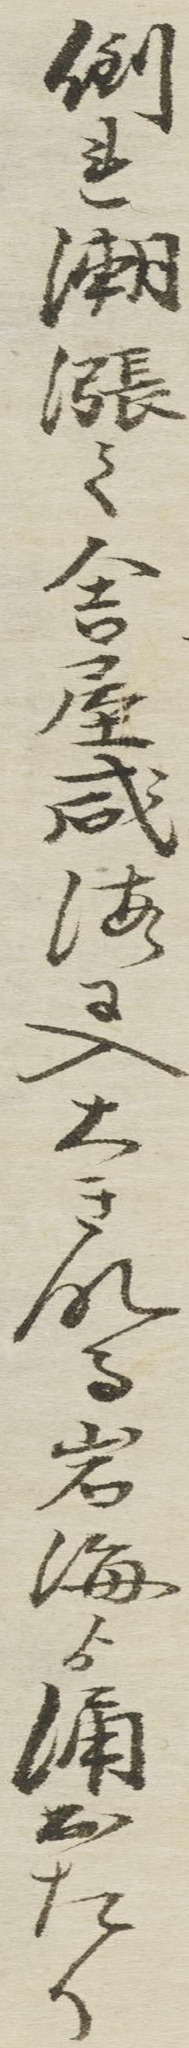倒れ潮漲て舎屋咸海に入大きなる岩海ゟ涌出たり
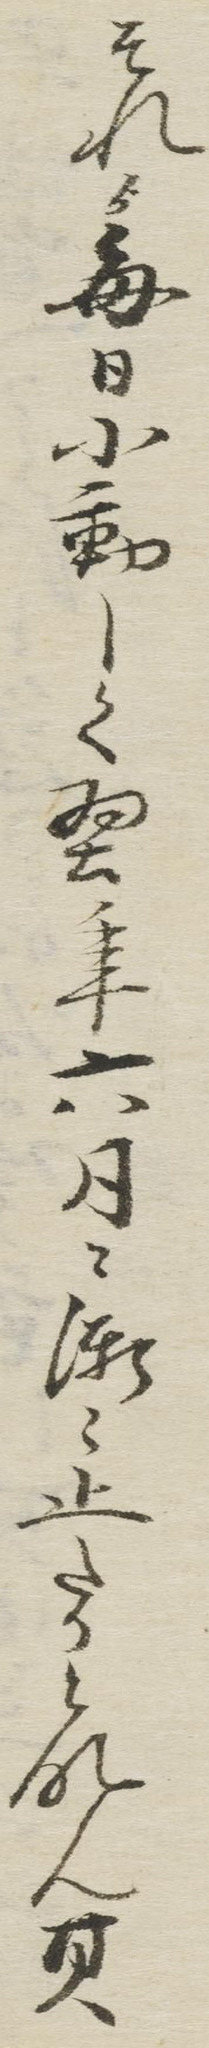それゟ毎日小動して翌年六月ニ漸々止たりとなん其
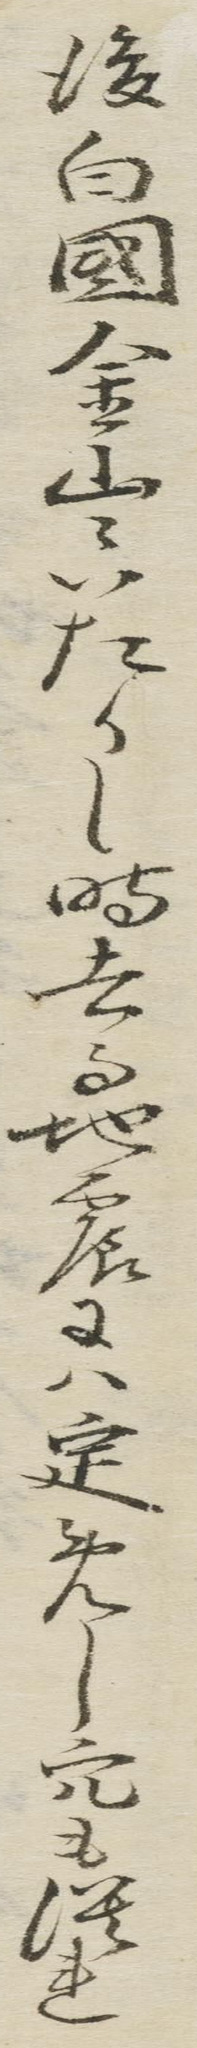後白国金山ニいたりし時去る地震にハ定めし穴も潰れ
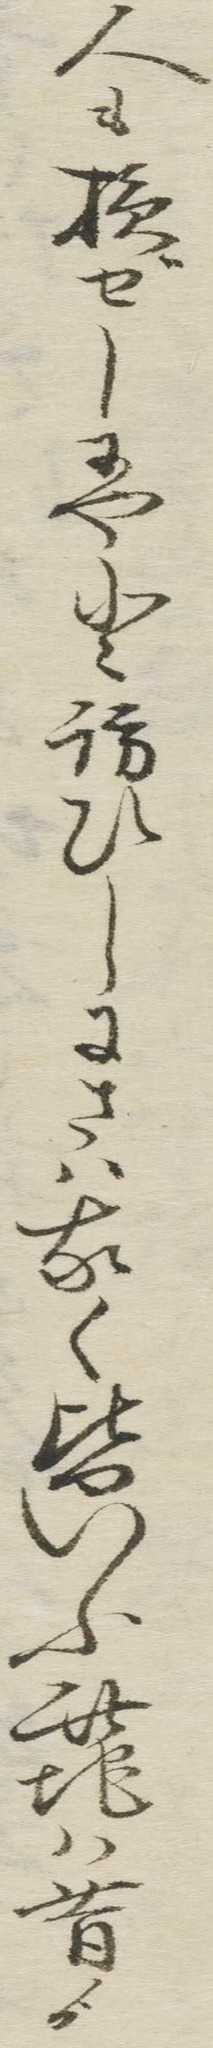人も損ぜしにやと訪ひしにさハなく皆いふ此地ハ昔ゟ
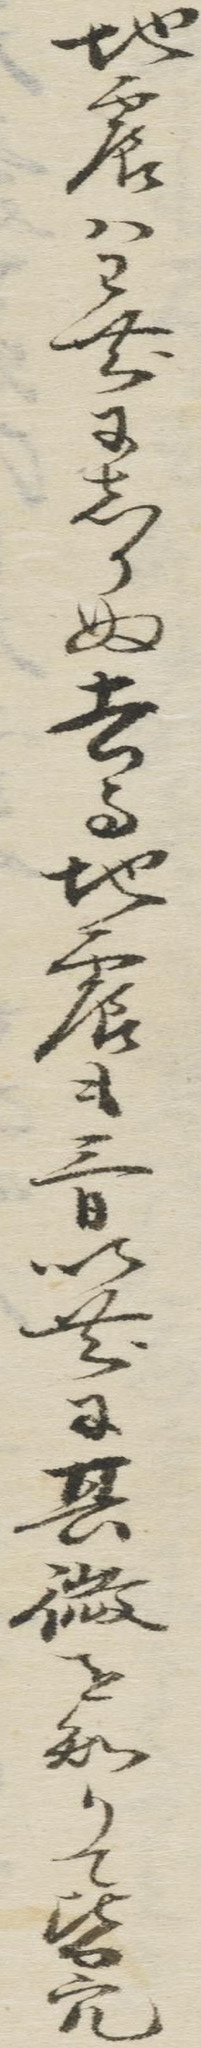地震ハ已前にしりぬ去る地震も三日以前に其徴を知りて皆穴
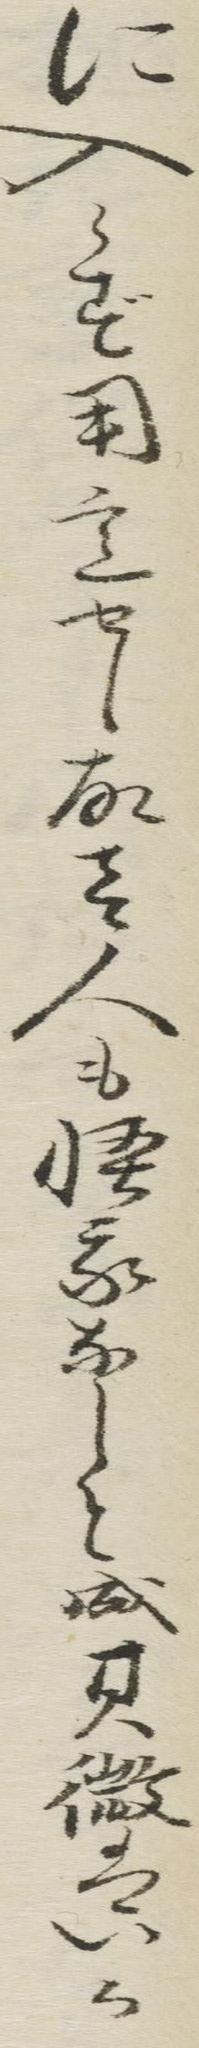に入らず用意セし故壱人も怪我なしと成其徴はいか
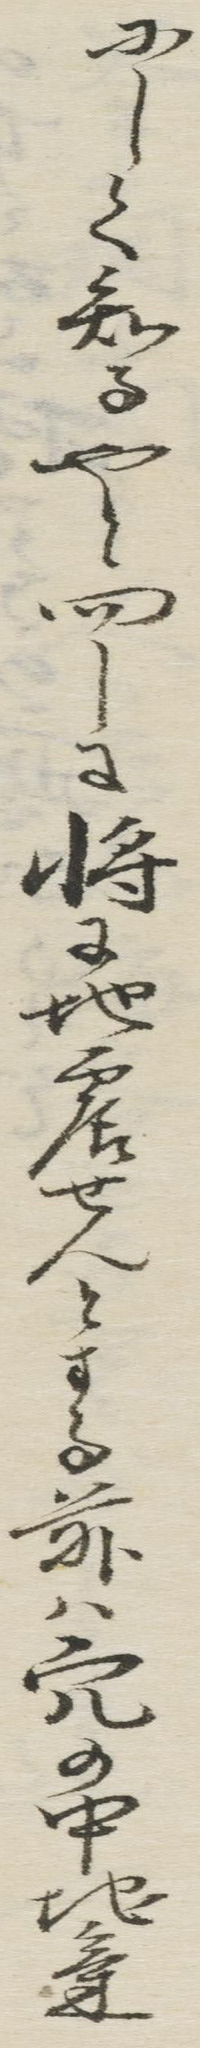にして知るやと問しに将に地震せんとする前ハ穴の中地気
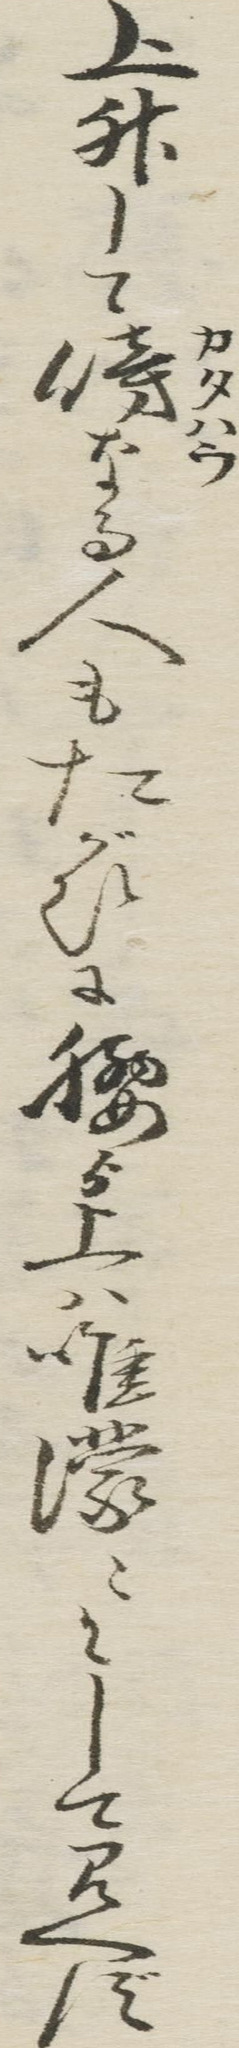上升して傍なる人もたがひに腰ゟ上ハ唯濛々として見へず
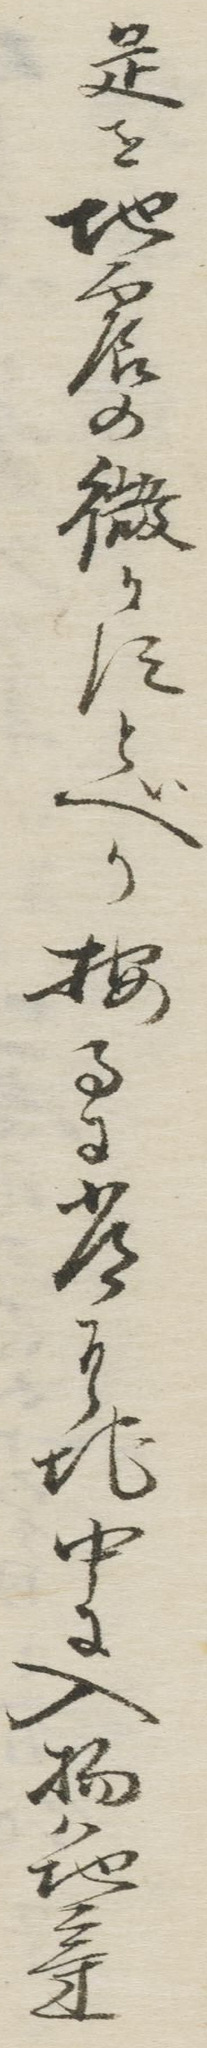是を地震の微にすといへり按るに常に地中に入物ハ地気
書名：諸国大地震大津波一代記
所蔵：東京大学地震研究所図書室 Earthquake Research Institute Library, The University of Tokyo, JAPAN
